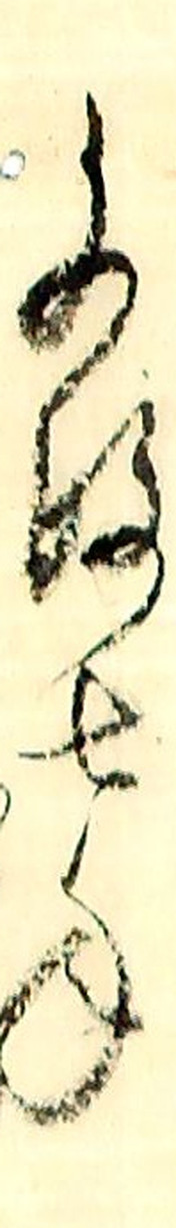文政七年
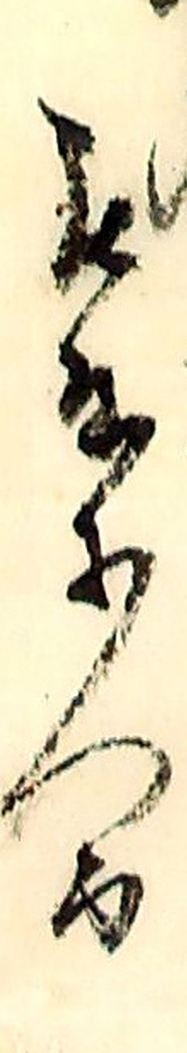庄屋五人与
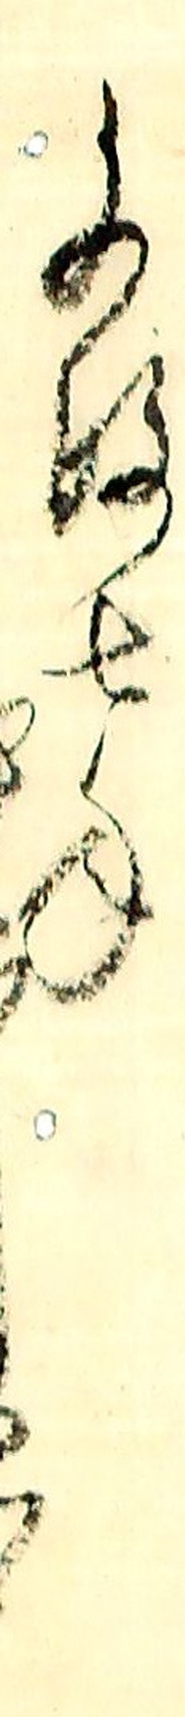文政七年
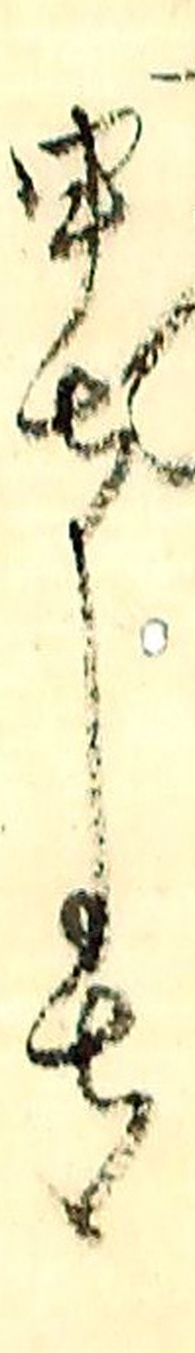申七月七日
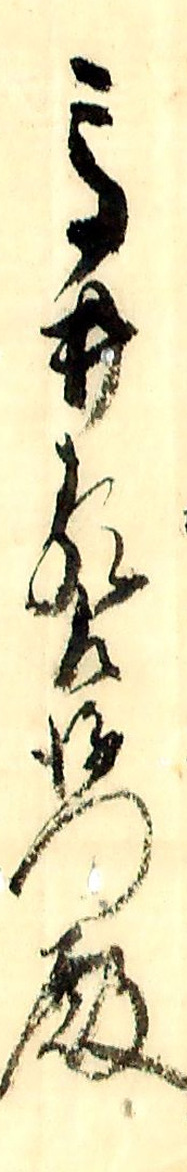高井類左衛門殿

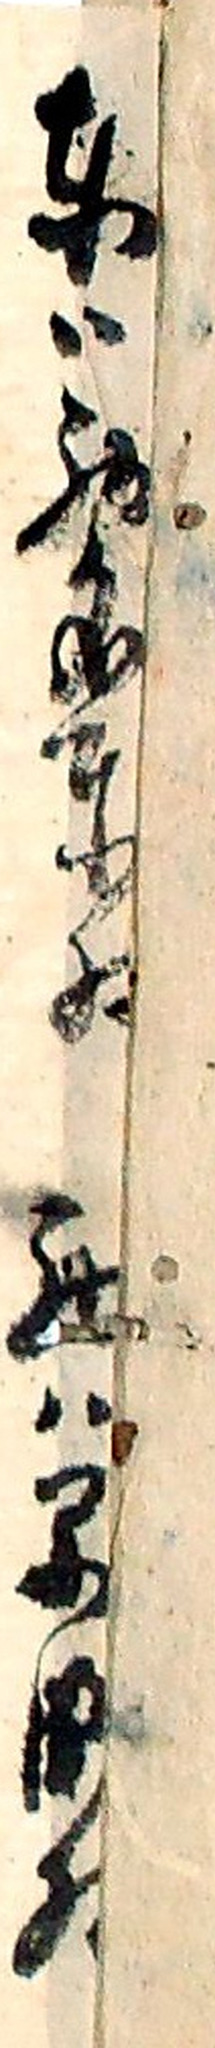東は西名東村西は早淵村
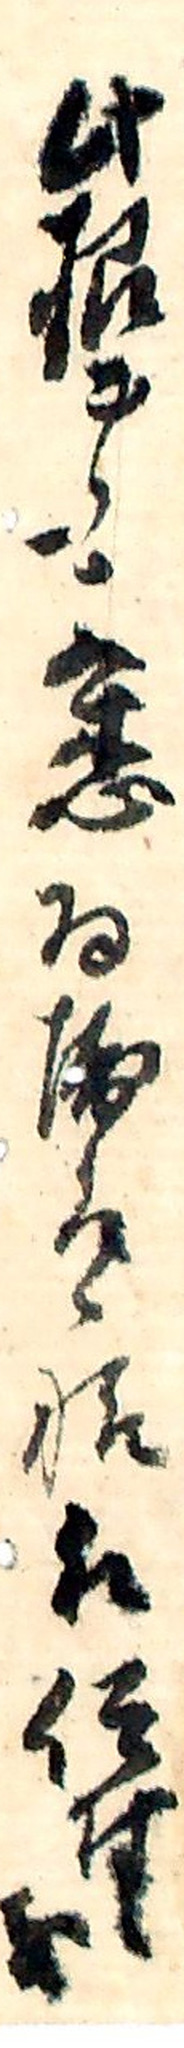此根をも悉為掘取候様被仰付候義
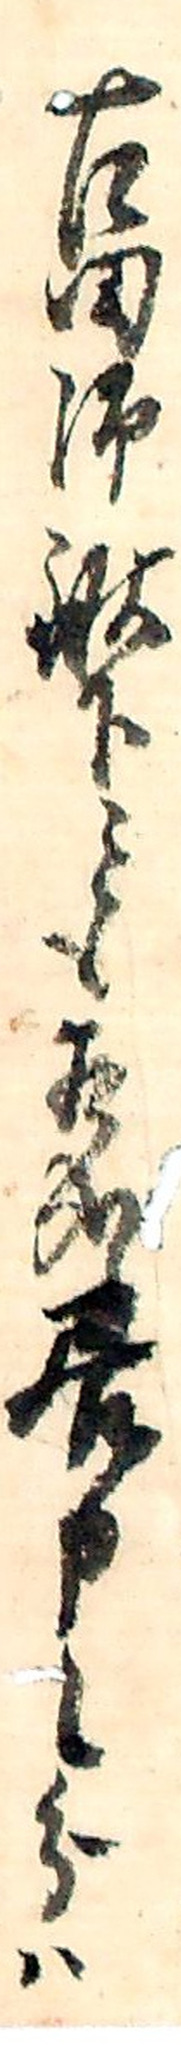古田御鍬下にも相成居申候分は
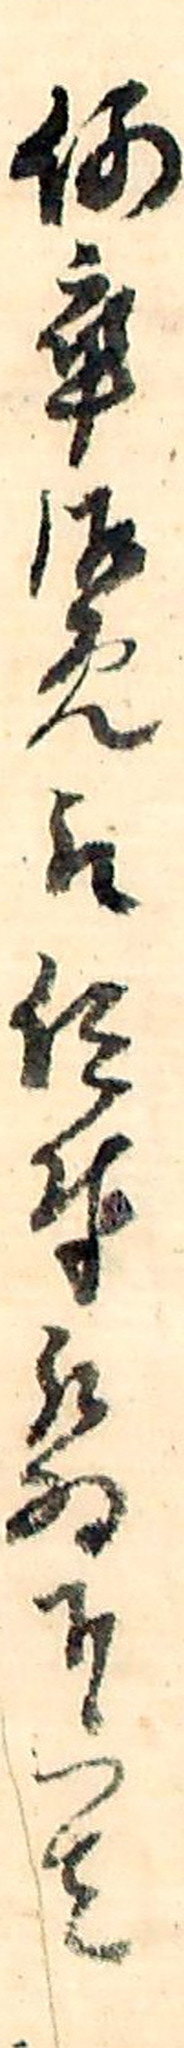何卒御免被仰付被為下候へは
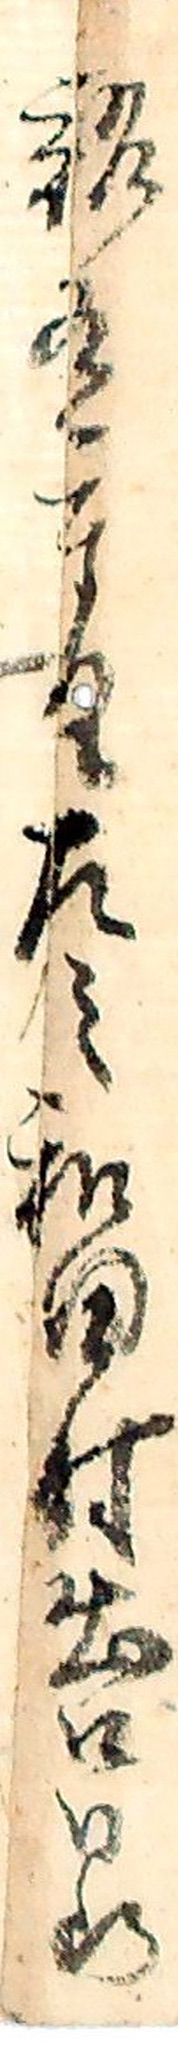難有奉存候左之和田村出口同断
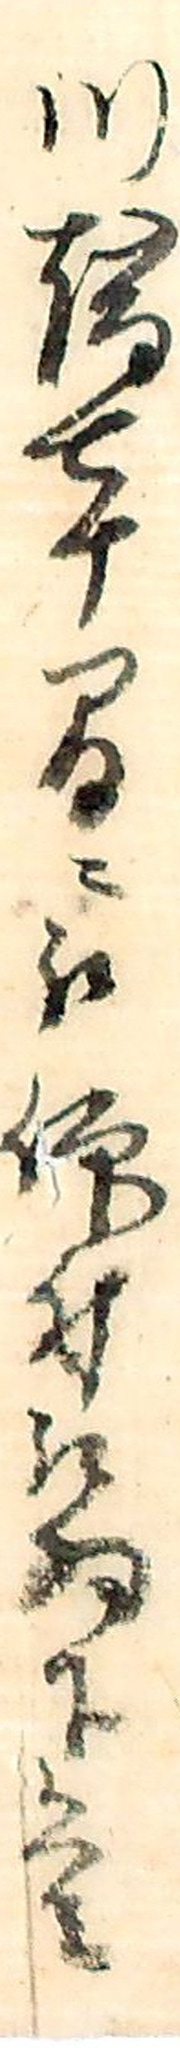川端七十間に被仰付被為下候へは
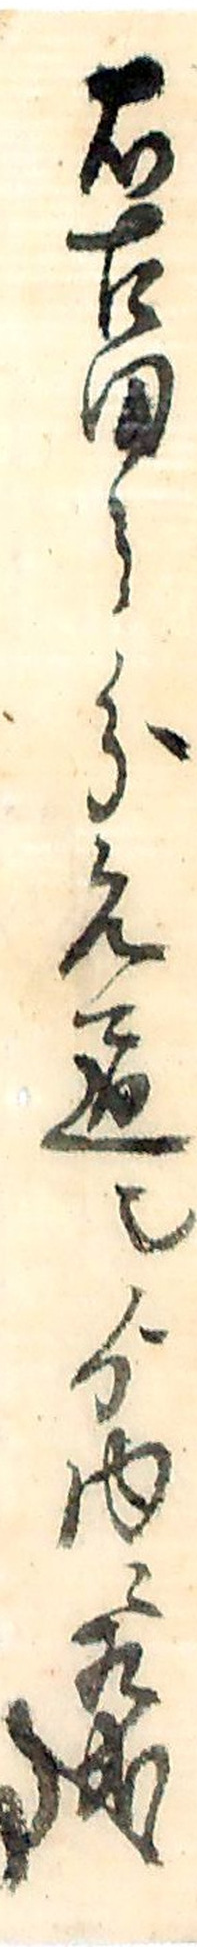右古田之分元通しゟ内に相成候事
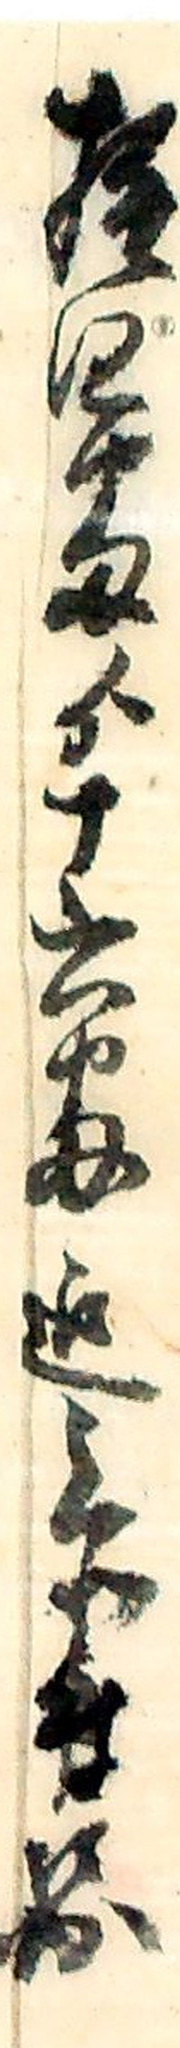拾四番ゟ十六番迄之所付図
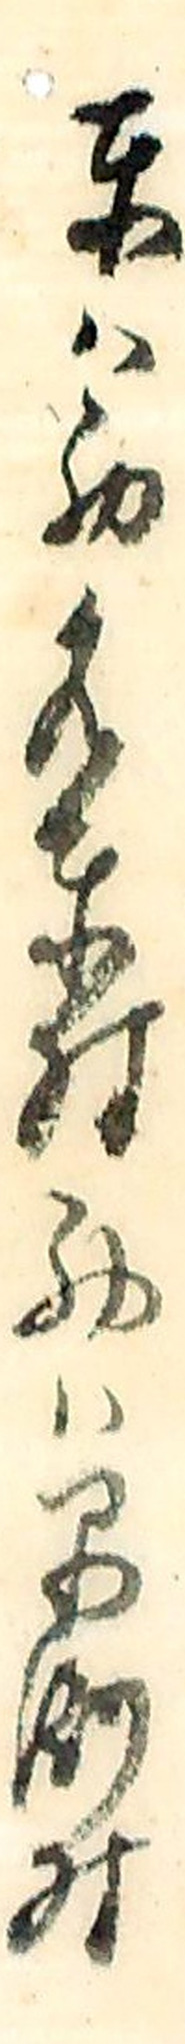東は西名東村西は早淵村
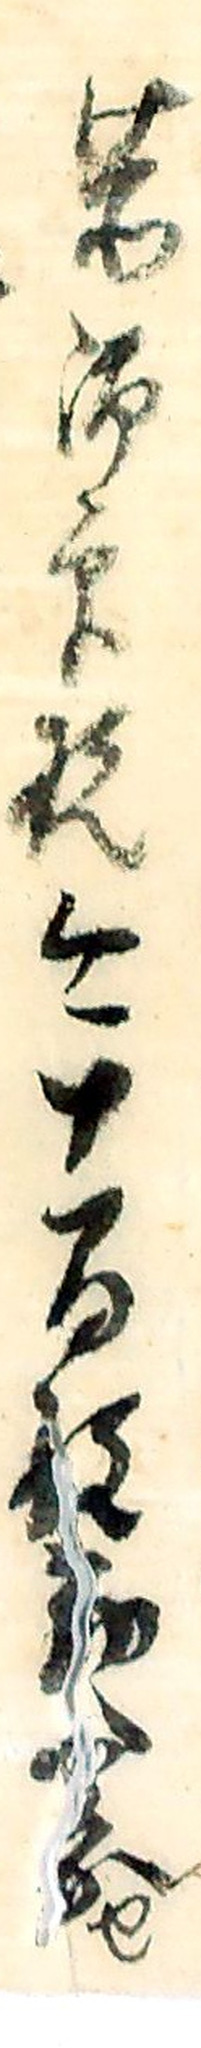此所御印杭今十間程西へ寄せ
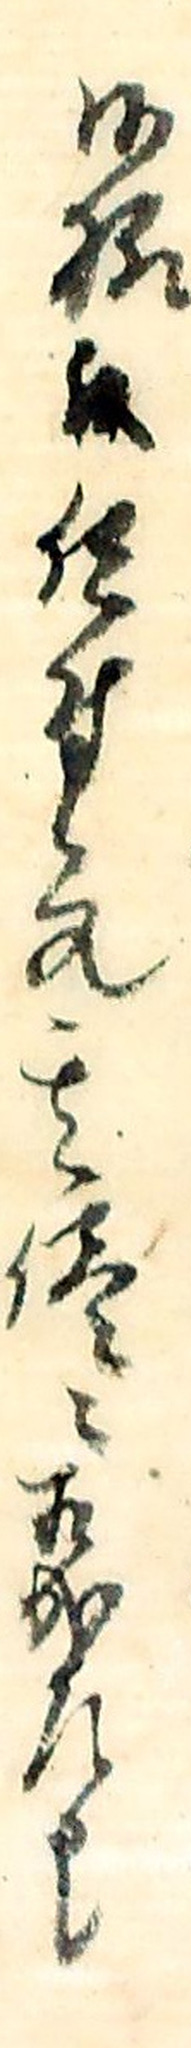候様被仰付候共其儘に相成居申候
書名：諸御願書控(後藤氏壱番）
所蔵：鳴門教育大学 Naruto University of Education
